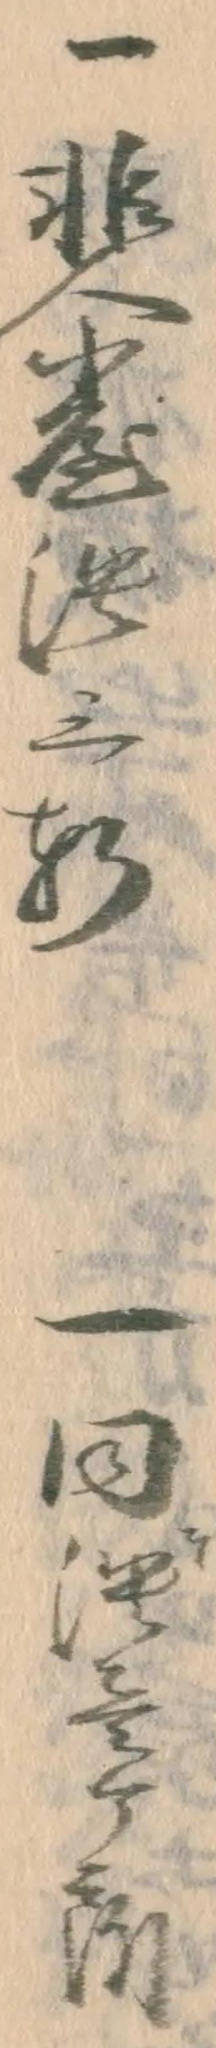一非人小屋潰三軒一同潰壱ヶ所
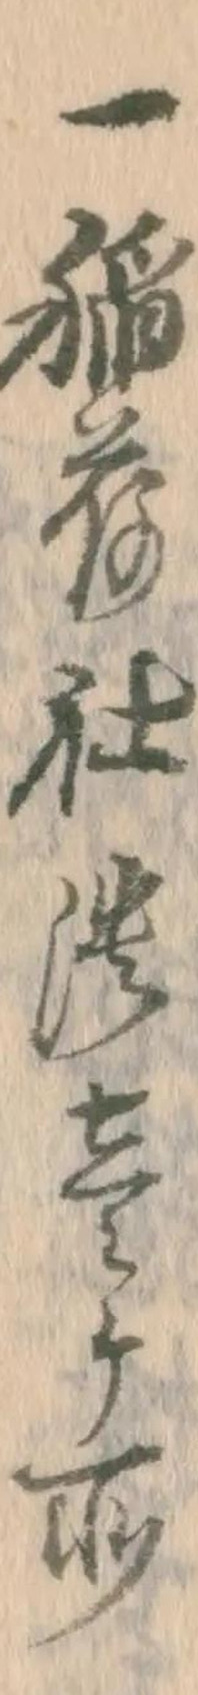一稲荷社潰壱ヶ所
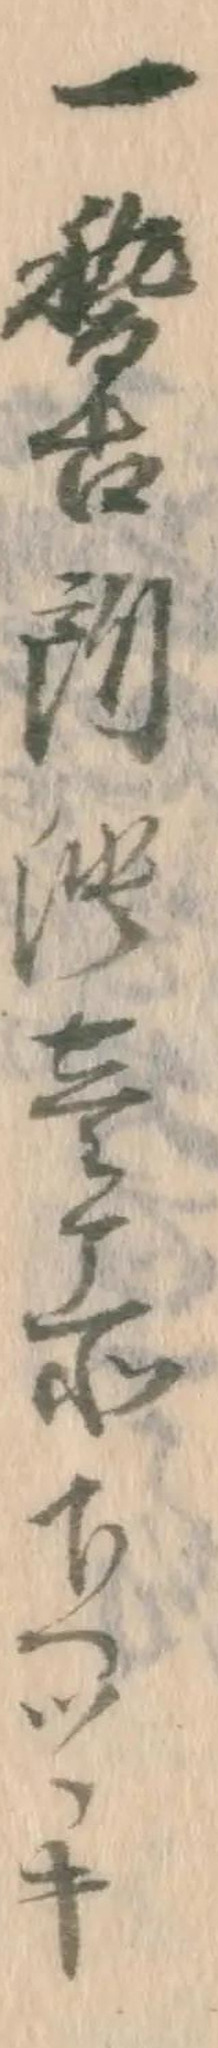一稽古所潰壱ヶ所下へツゝキ
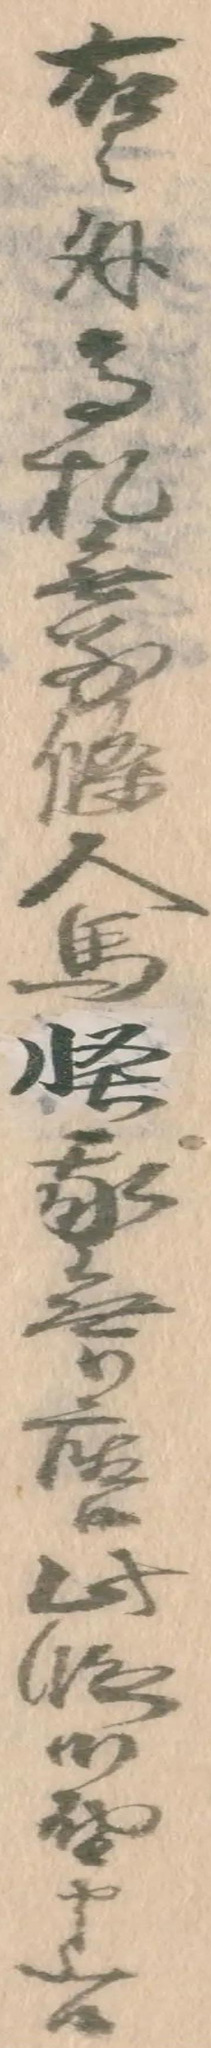右之外高札場無別条人馬怪我無御座候此段御届申上候
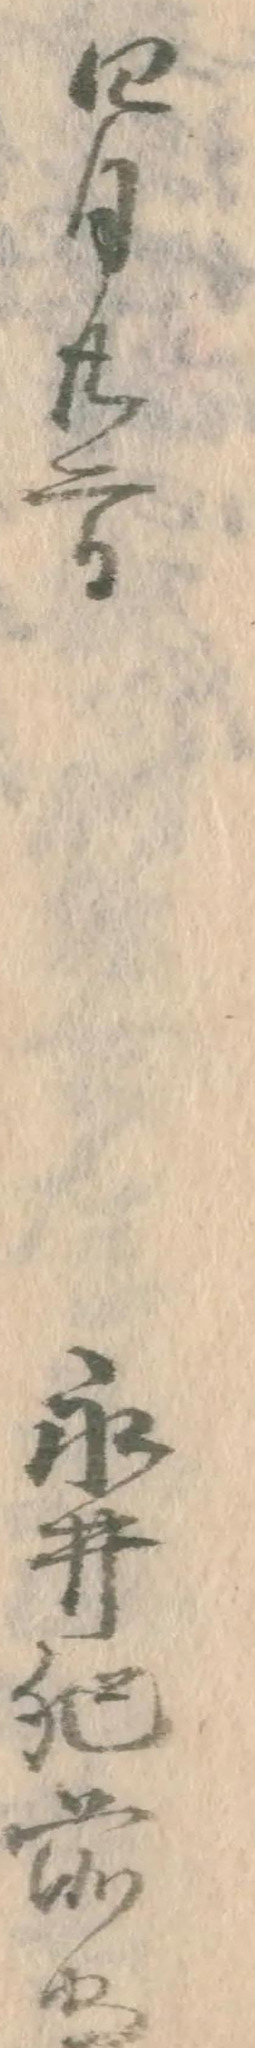四月廿二日永井肥前守
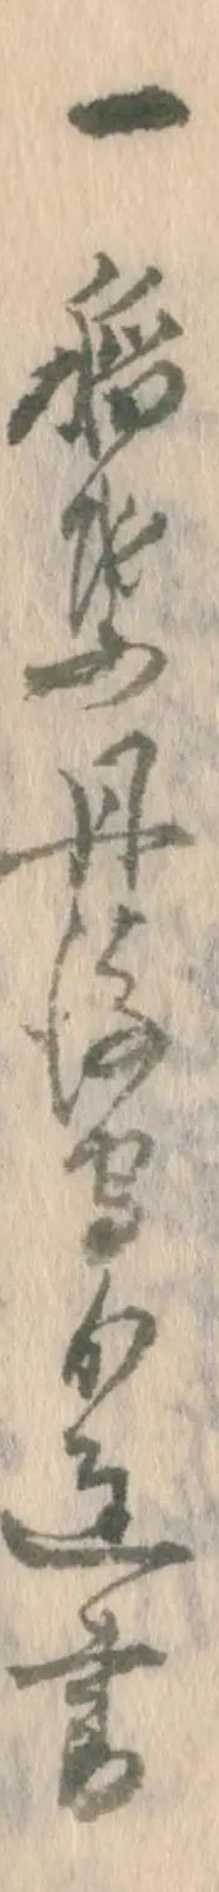一稲葉丹後守ゟ達書
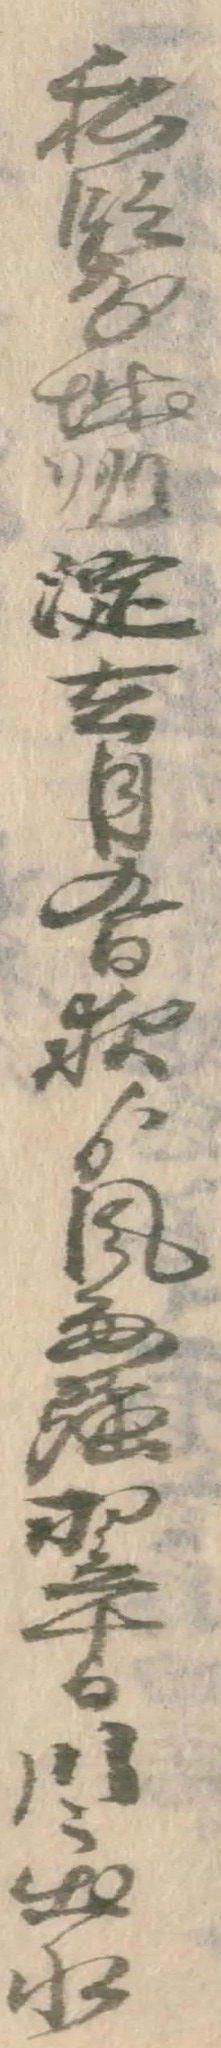私領分城州淀去月九日夜ゟ風雨強翌十日川々出水
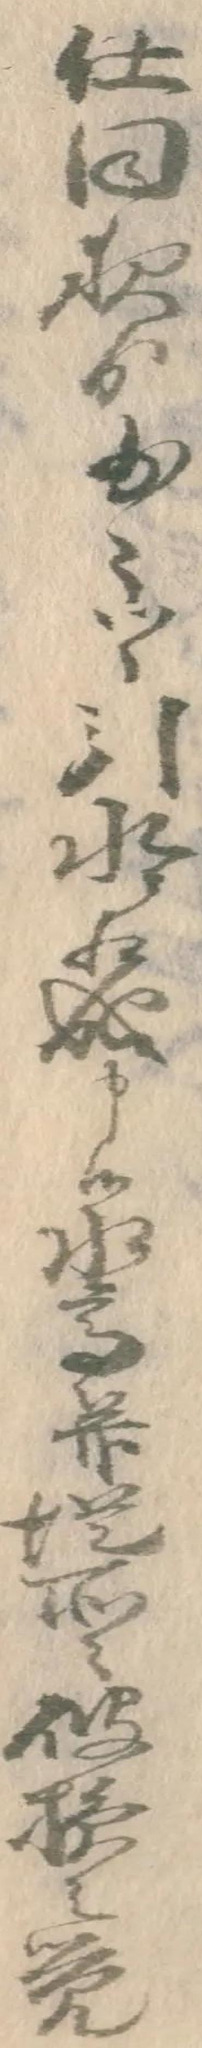仕同夜ゟ少々ツゝ引水二相成申候水高并堤所々破損之覚
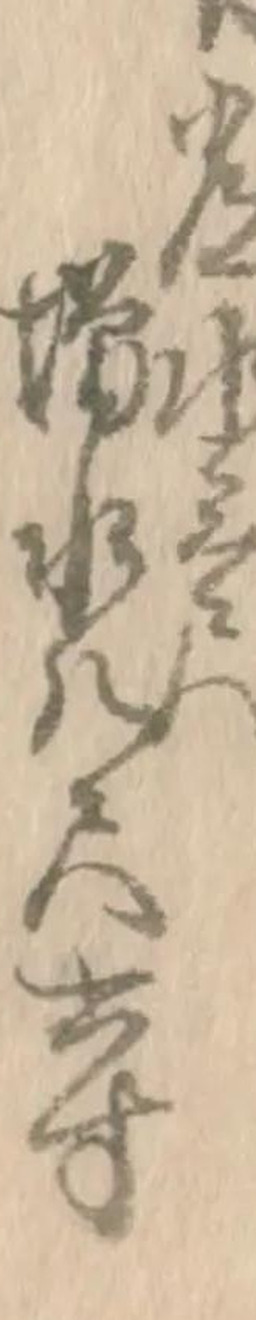増水八尺六寸
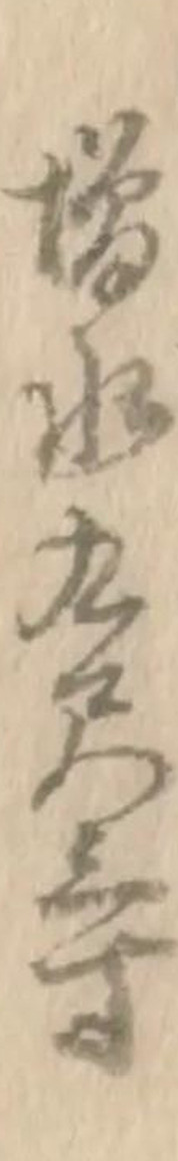増水九尺三寸

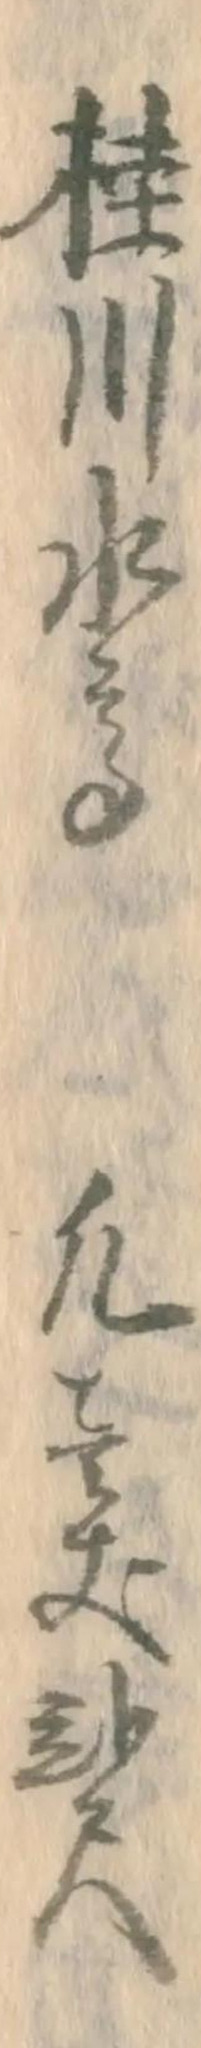桂川水嵩凡壱丈弐尺
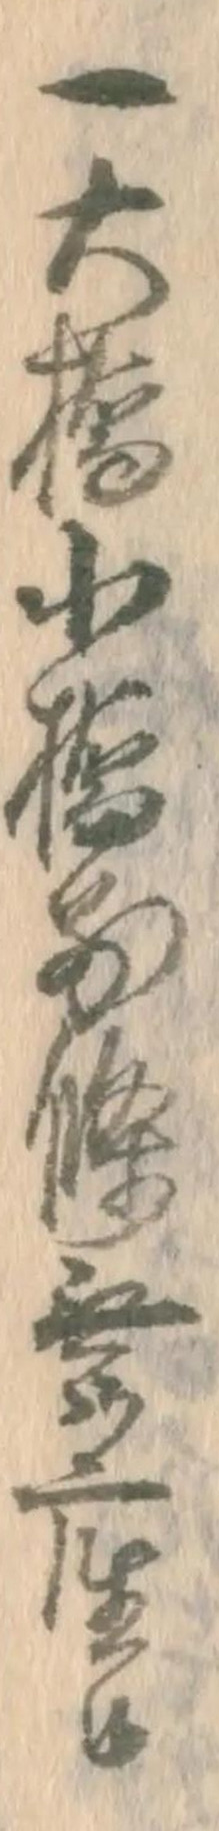一大橋小橋別条無御座候
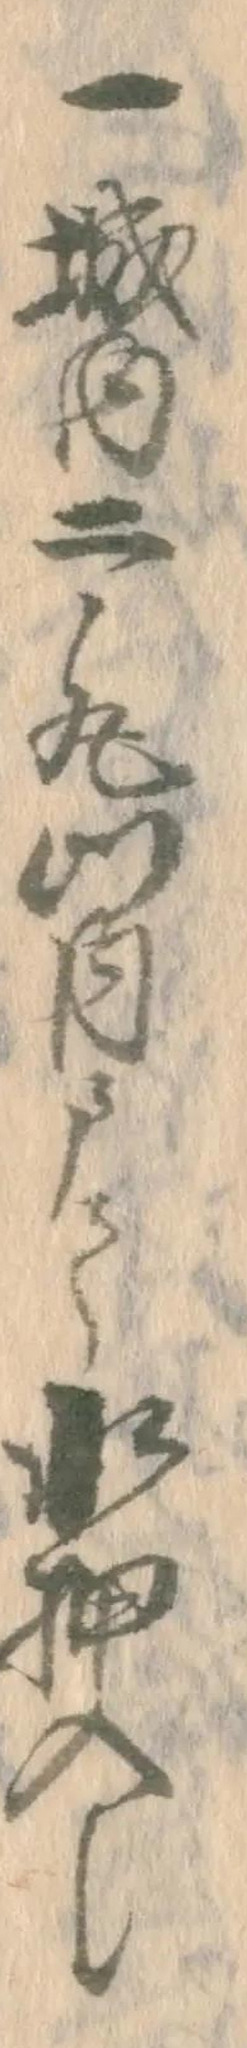一城内二ノ丸門内にて水押入申候
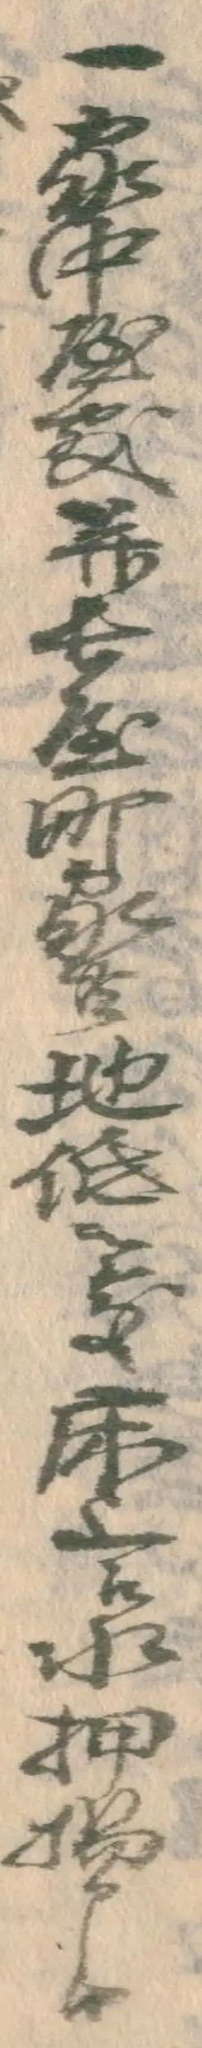一家中屋敷并長屋町家居地低之処床上江水押揚申候
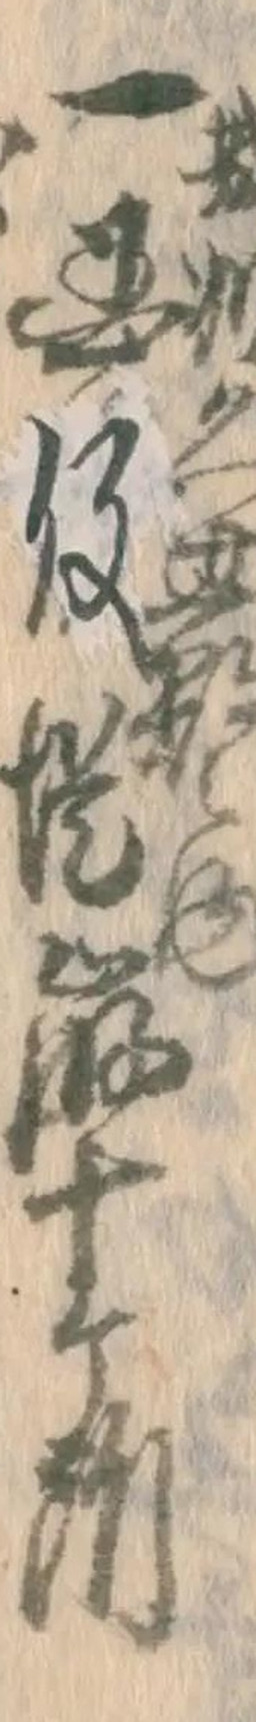一国役堤欠所十ヶ所
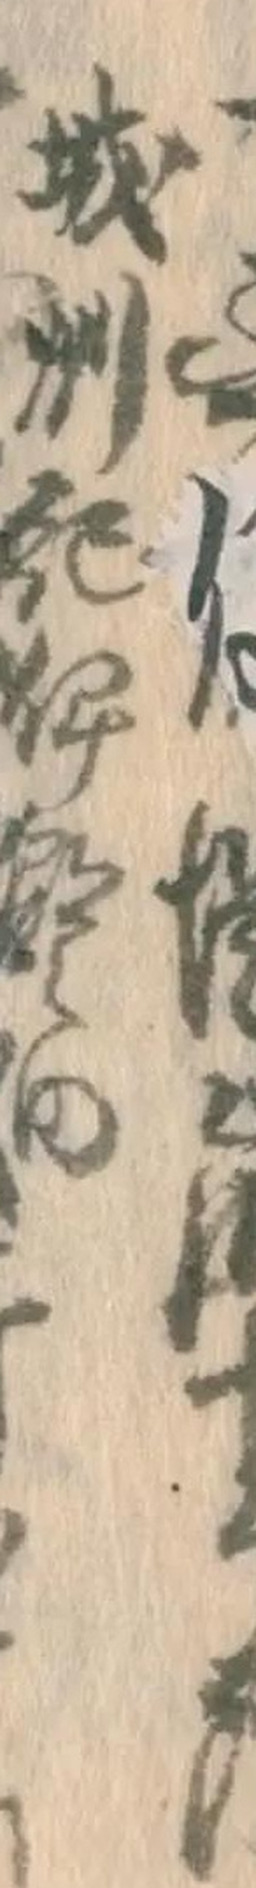城州紀伊郡之内
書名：信州大地震之記
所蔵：国立国会図書館 National Diet Library, JAPAN
